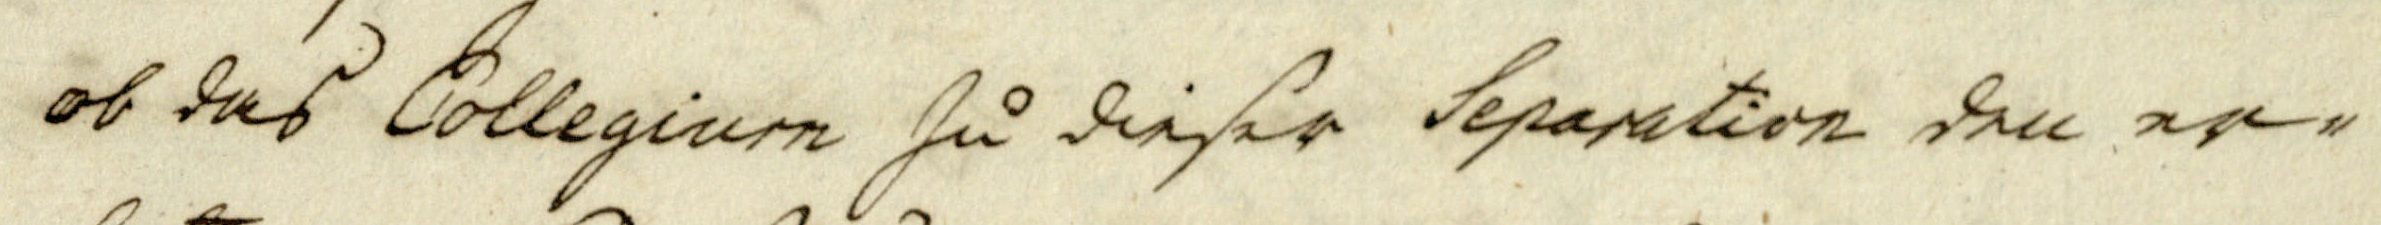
ob das Collegium zu dieser Separation den er¬
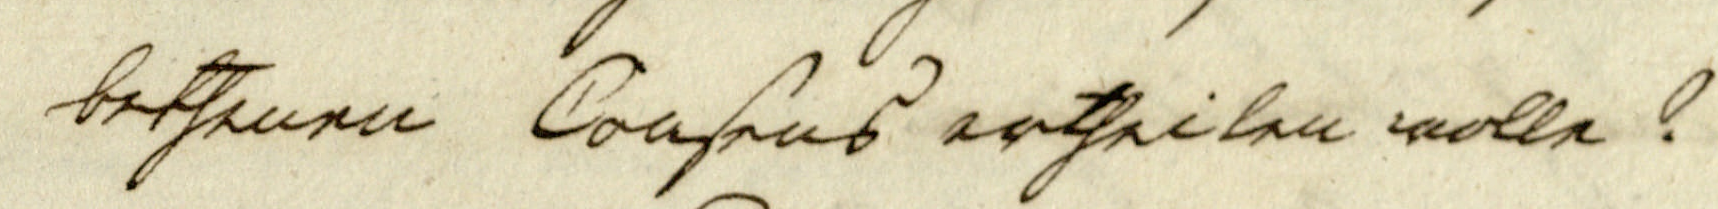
bethenen Consens ertheilen wolle?
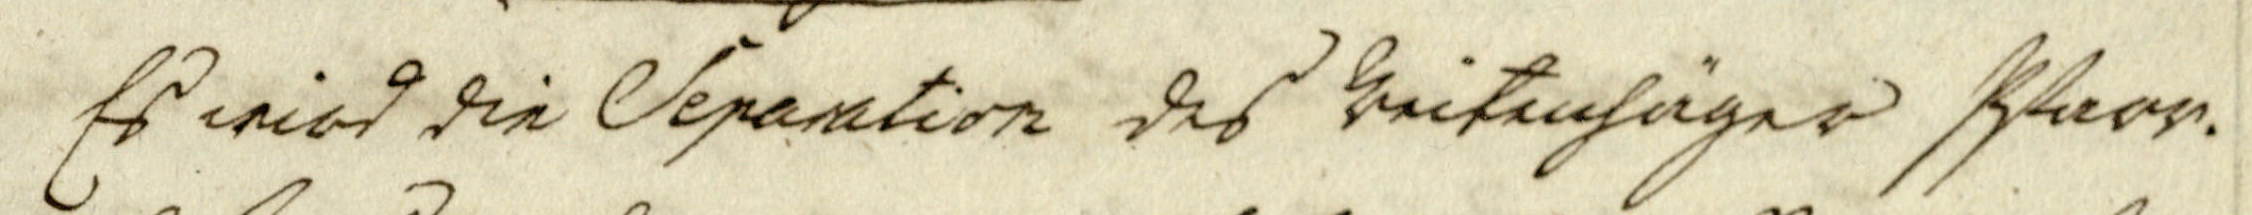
Es wird die Separation des Weitenhäger Pfarr¬
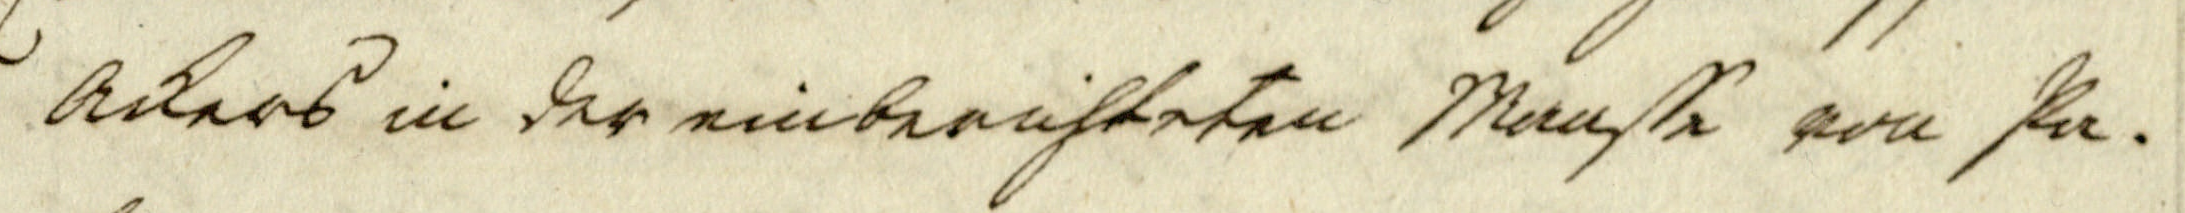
Ackers in der einberichteten Maasse von Pa¬
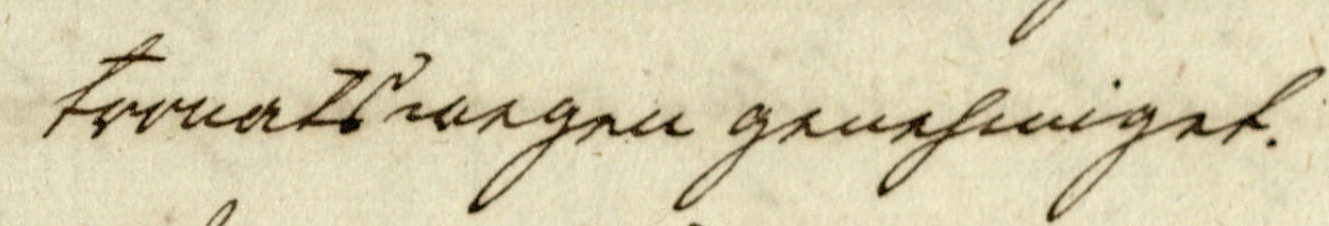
tronatswegen genehmiget.
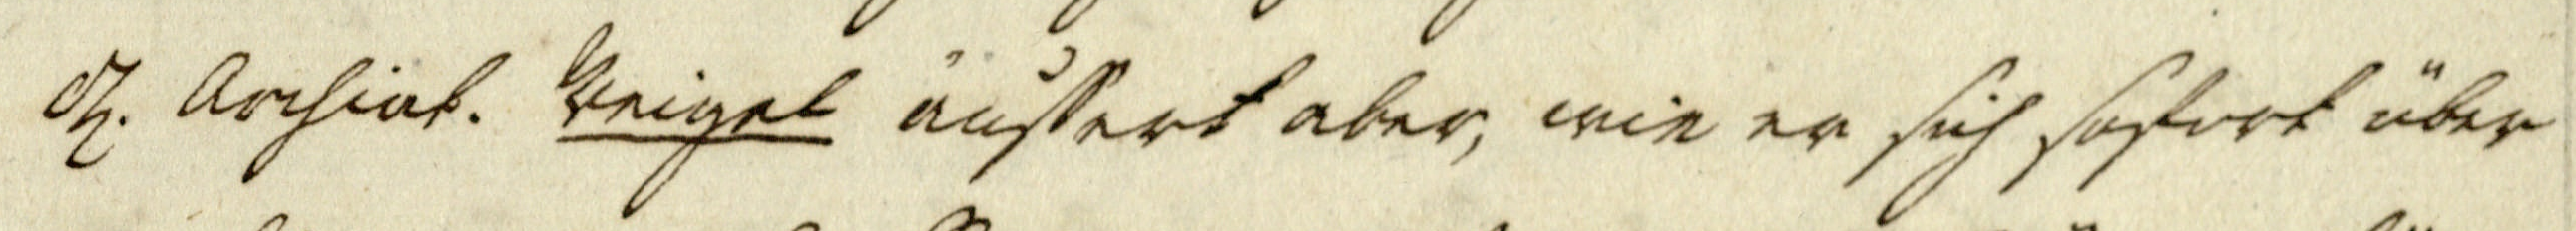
dh. Archiat. Weigel äussert aber, wie er sich sofort über
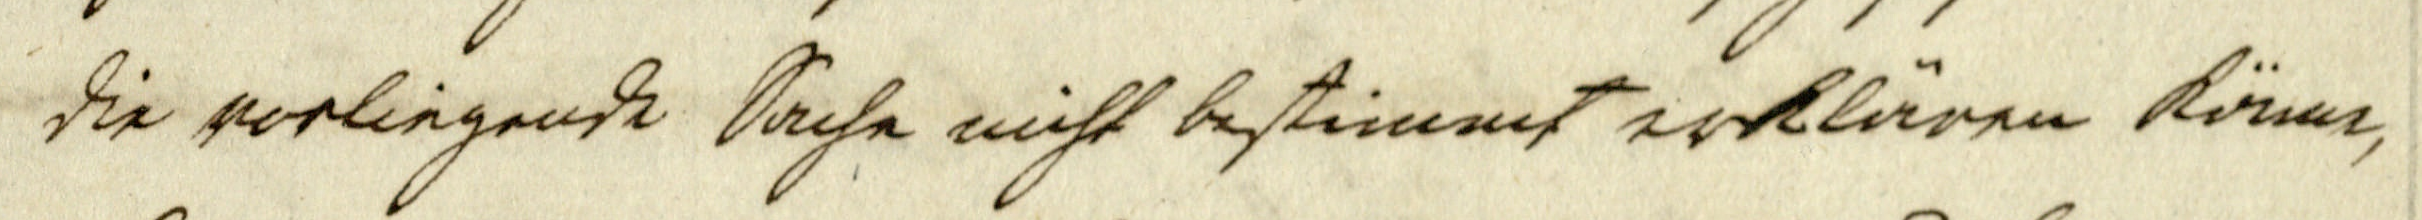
die vorliegende Sache nicht bestimmt erklären könne,
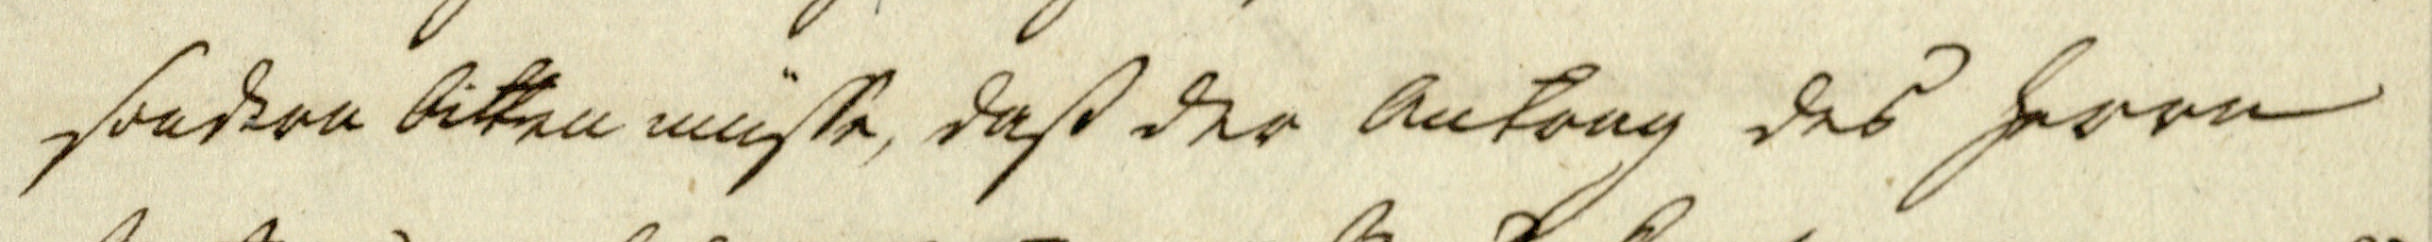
sondern bitten müsse, daß der Antrag des herrn
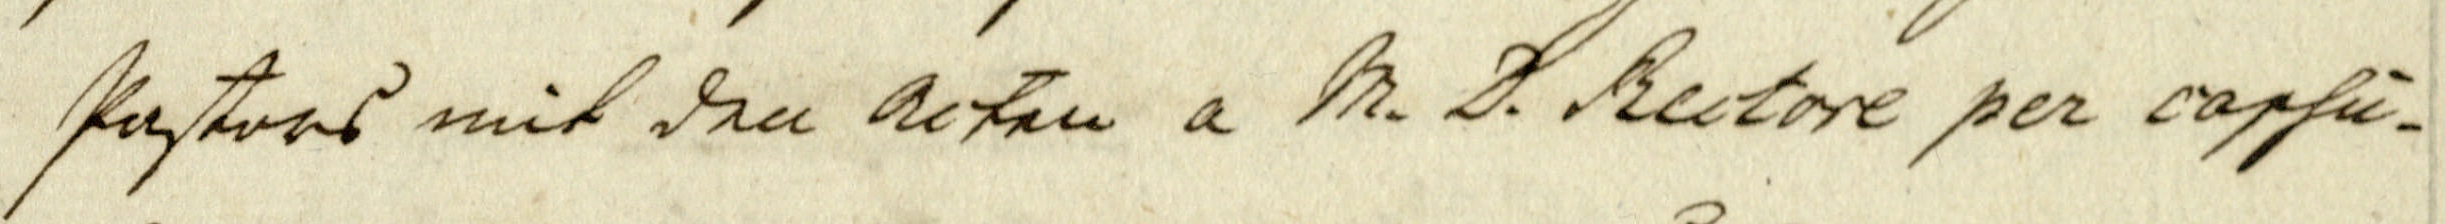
Pastors mit den Acten a M. D. Rectore per capsu¬
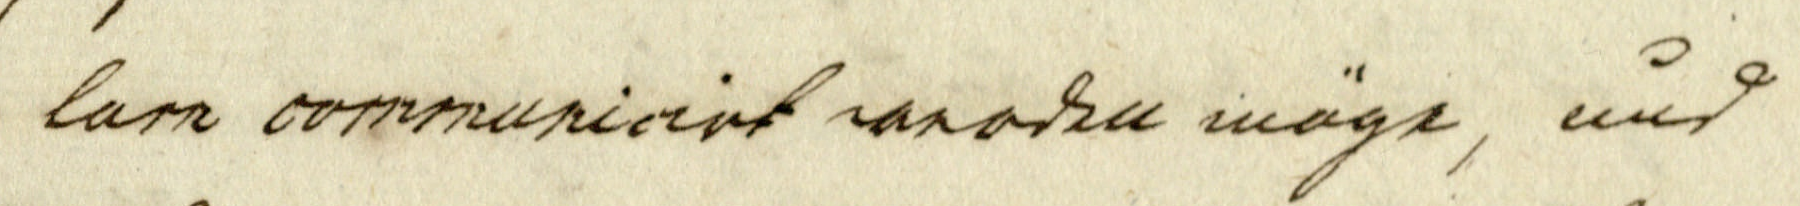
lam communicirt werden möge, und
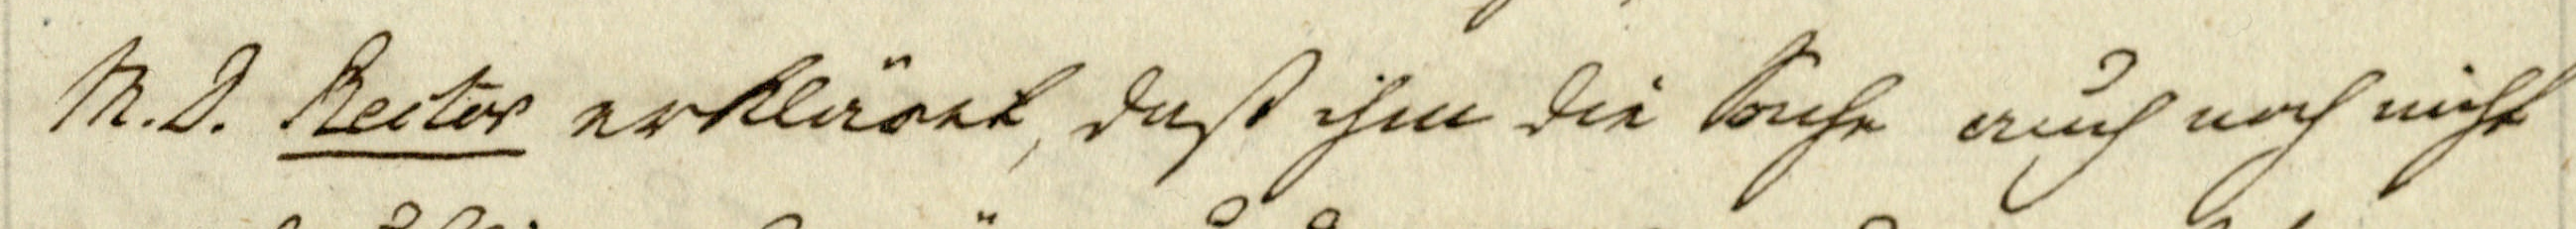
M. D. Rector erkläret, daß ihm die Sache auch noch nicht
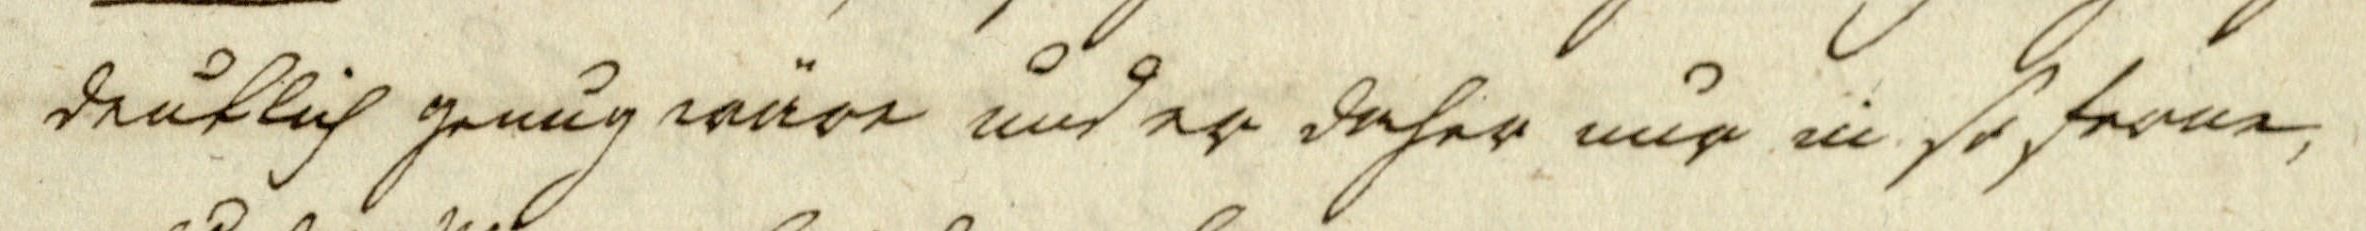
deutlich genug wäre und er daher nur in so ferne,
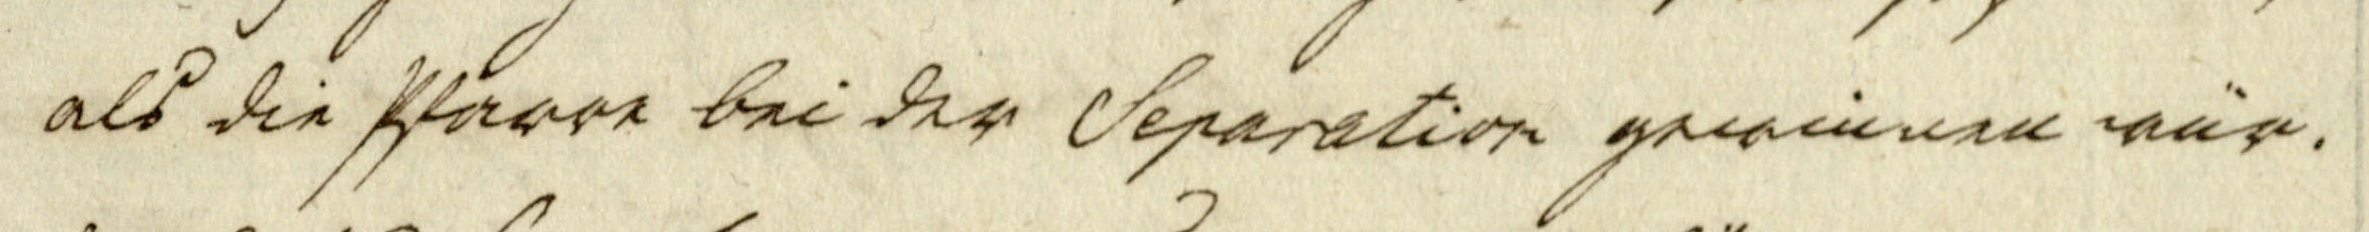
als die Pfarre bei der Separation gewinnen wür¬
